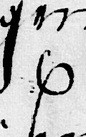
le.
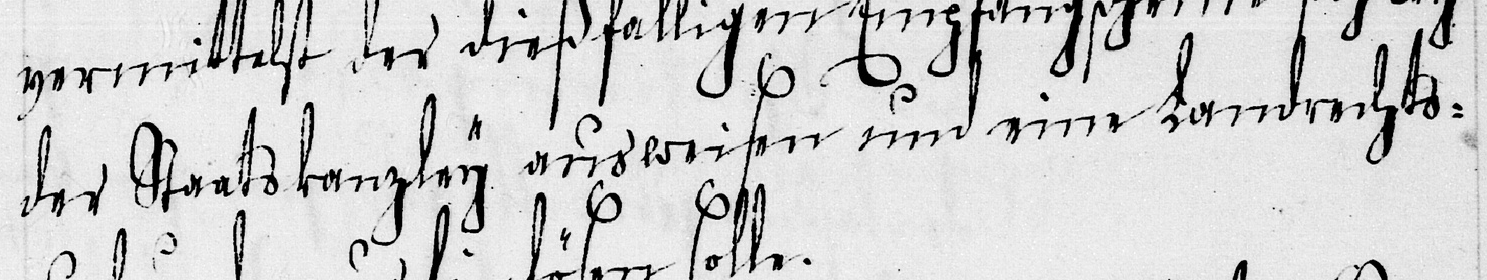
der Staatskanzley ausweisen und eine Landrechts¬
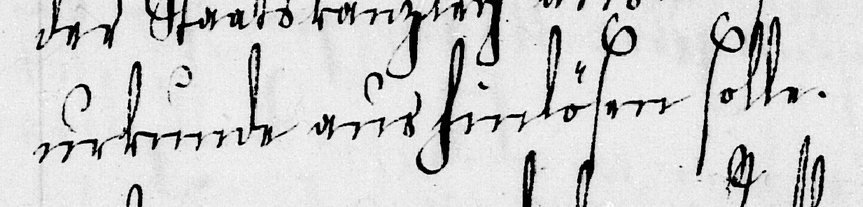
urkunde aushinlösen sol¬
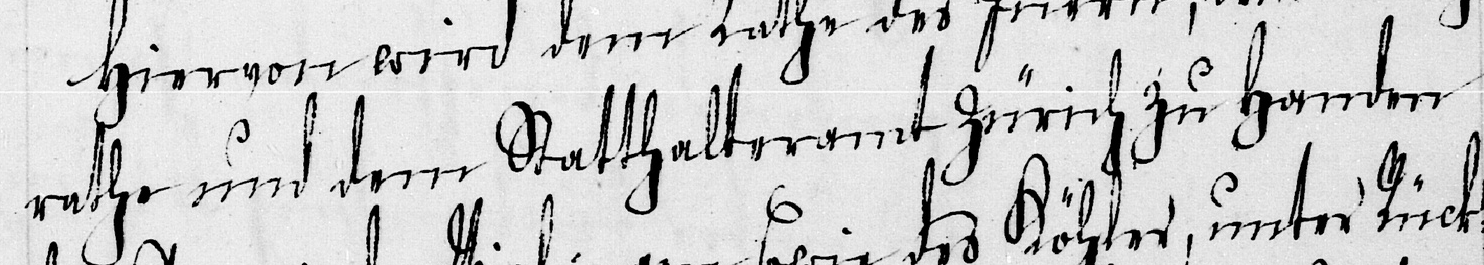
rathe und dem Statthalteramt Zürich zu Handen
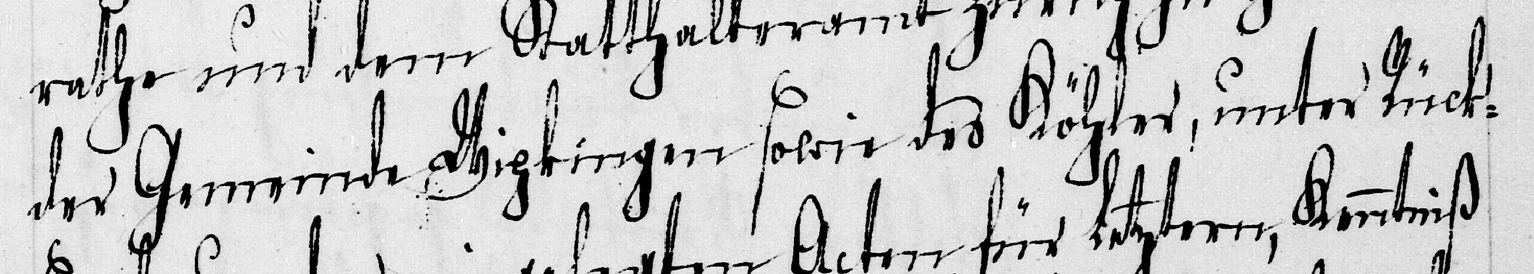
der Gemeinde Wipkingen sowie des Köhler, unter Rück¬
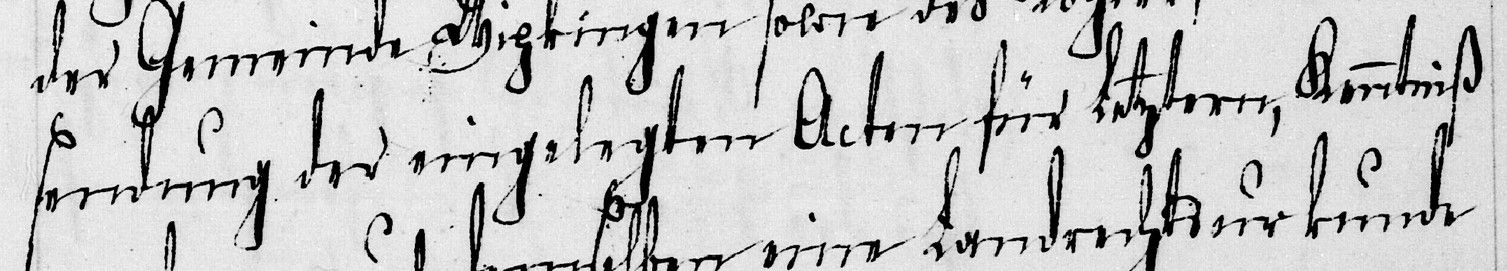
sendung der eingelegten Acten für Letztern, Kenntniß
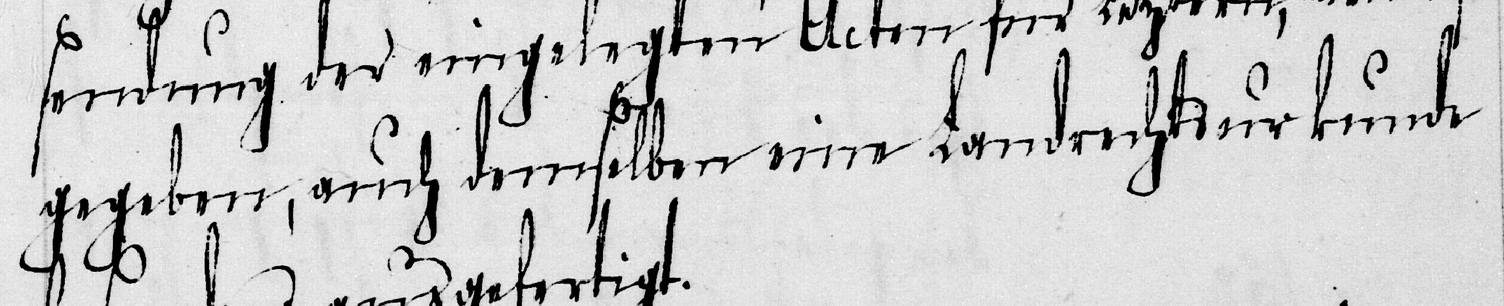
gegeben, auch demselben eine Landrechtsurkunde
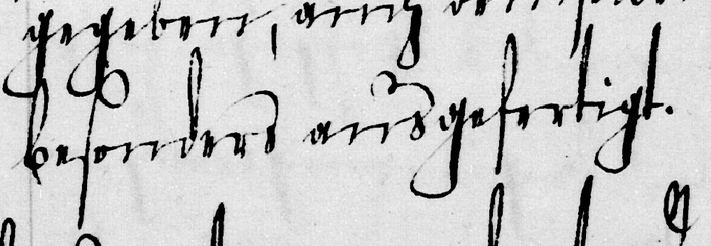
besonders ausgefertigt.
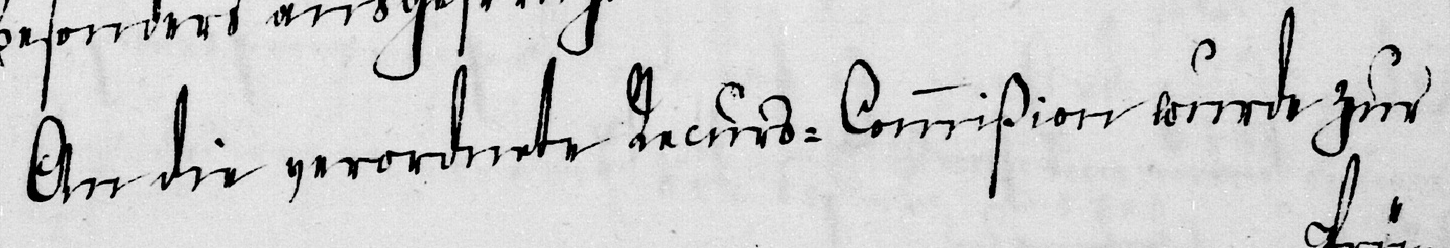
An die verordnete Recurs-Commißon wurde zur
